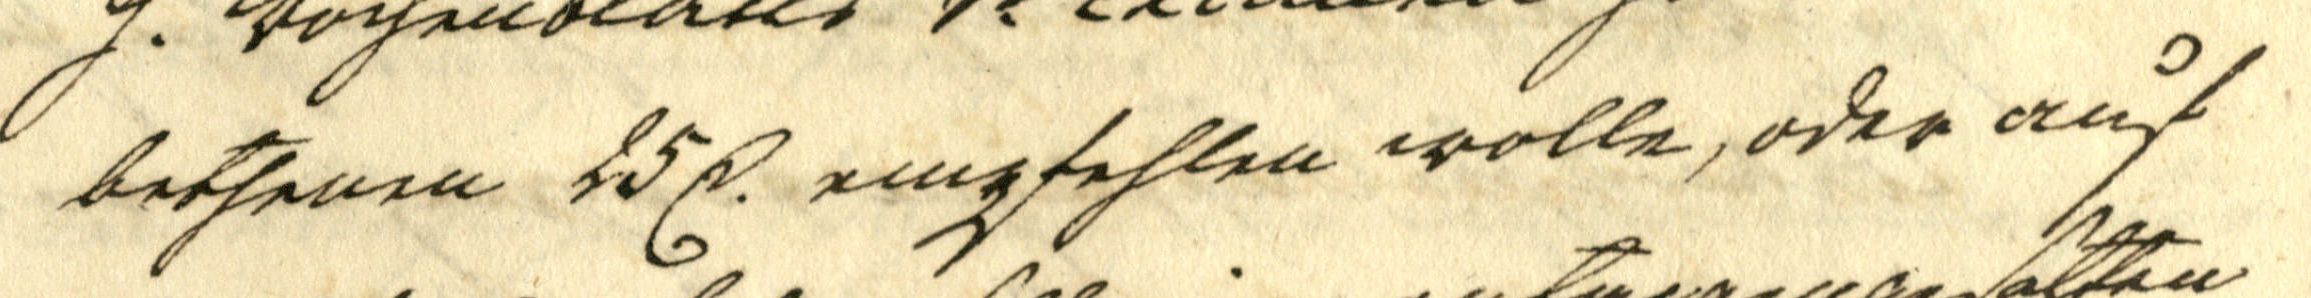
bethenen 25 l. empfehlen wolle, oder auf
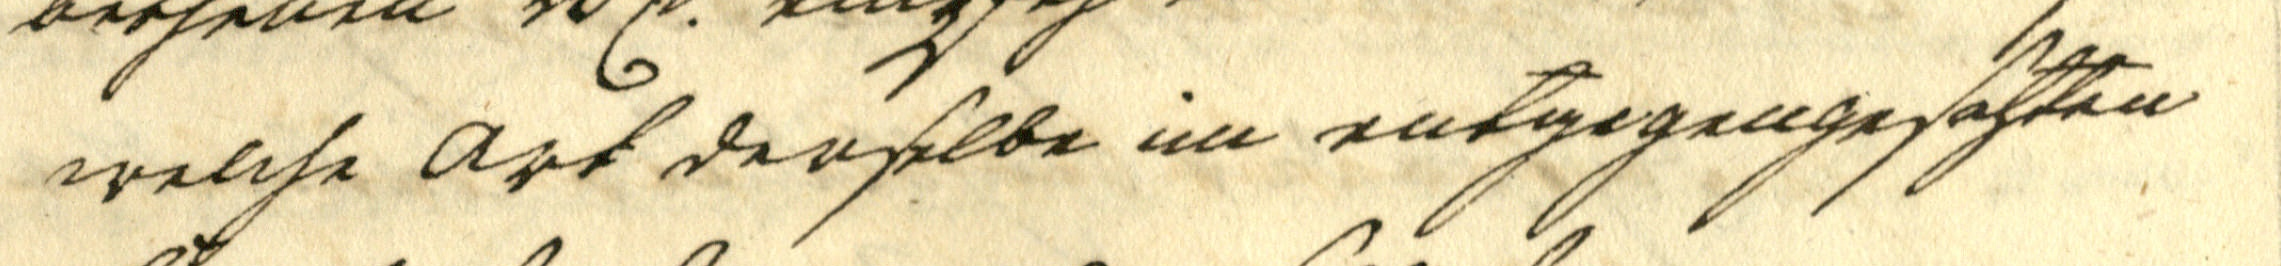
welche Art derselbe im entgegengesetzten
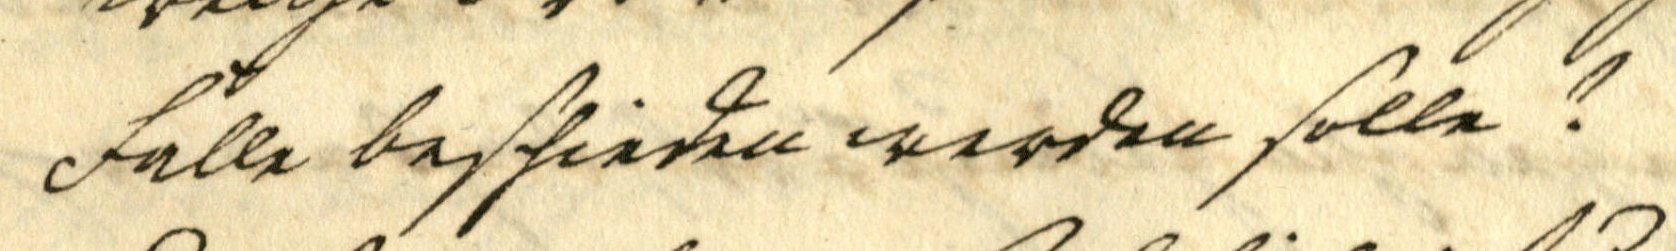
Falle beschieden werden solle?
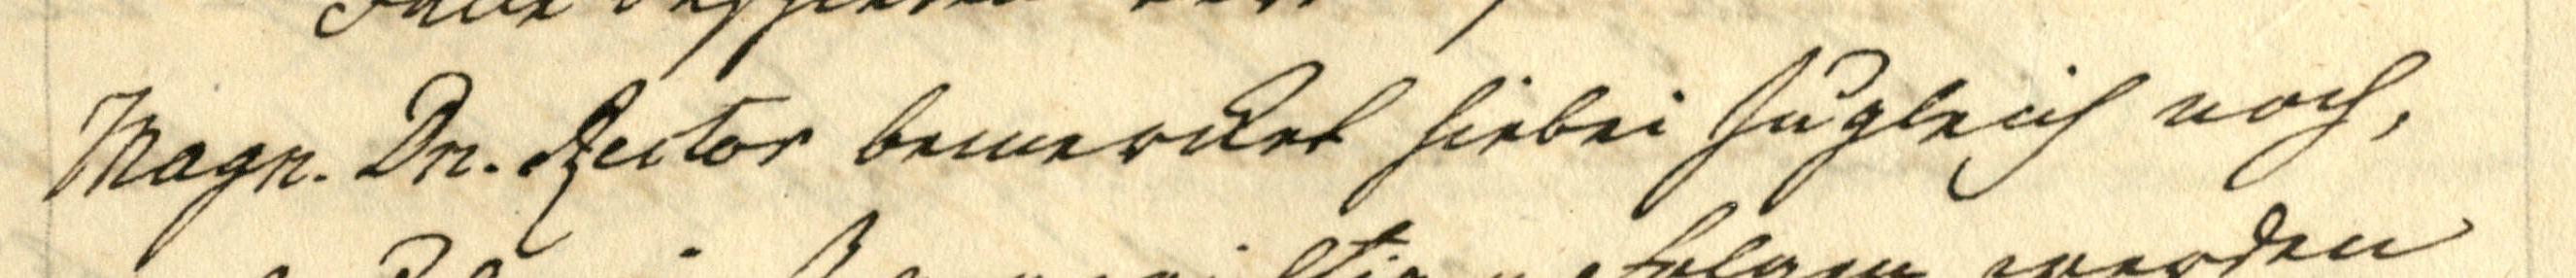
Magn. Dn. Rector bemerket hiebei zugleich noch,
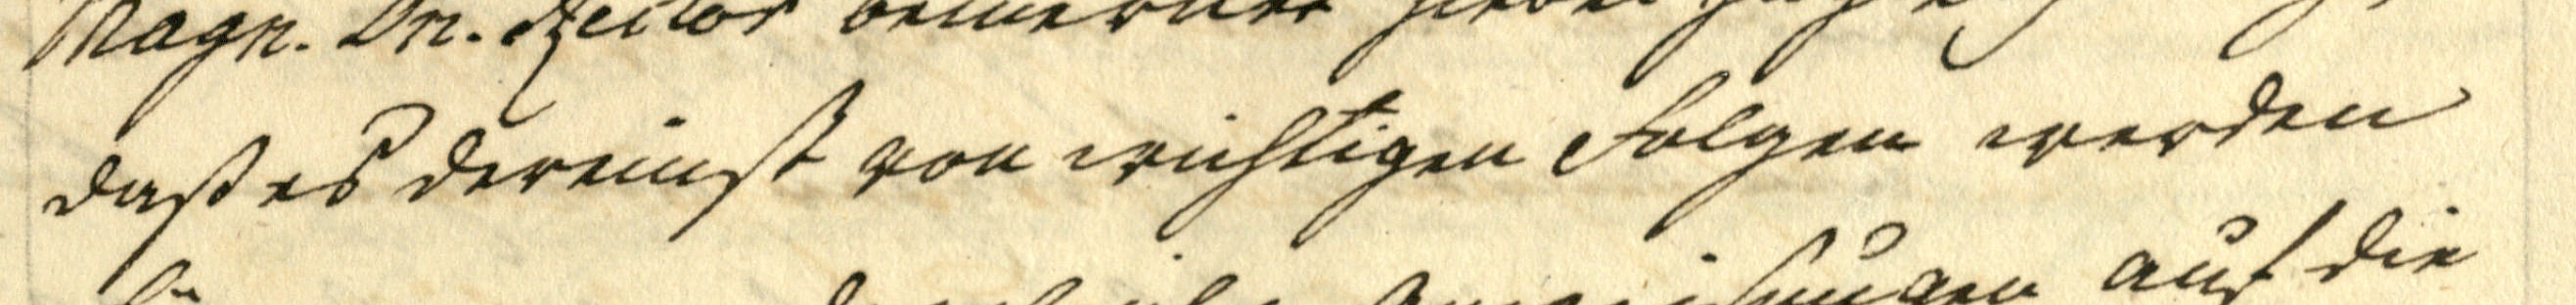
daß es dereinst von wichtigen Folgen werden
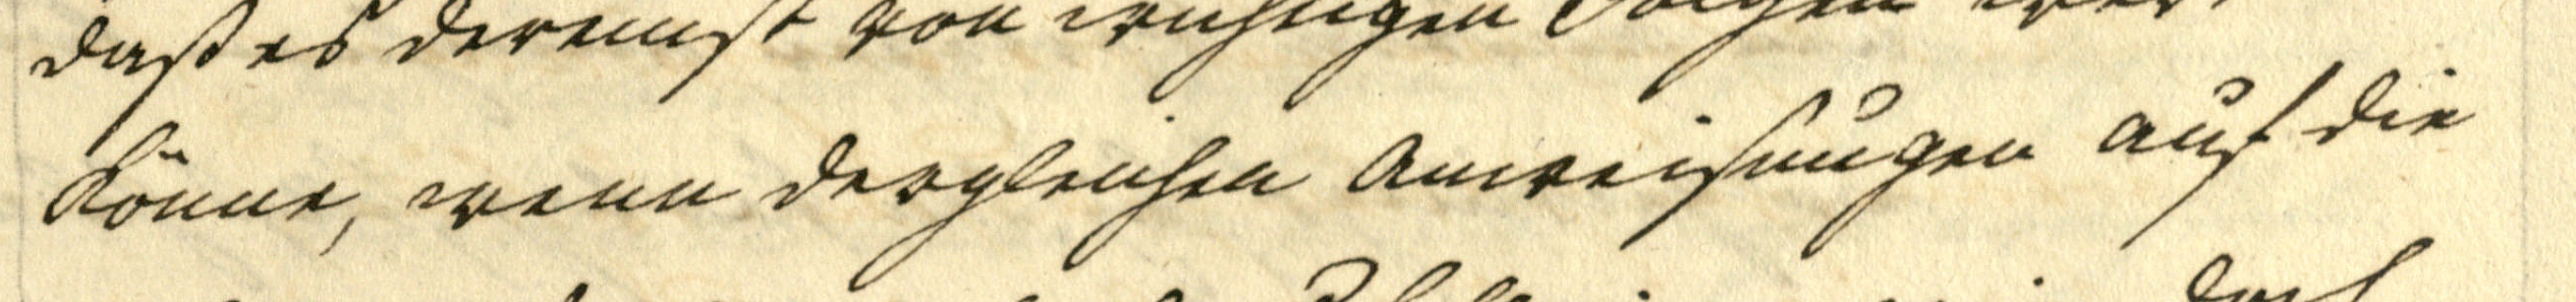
könne, wenn dergleichen Anweisungen auf die
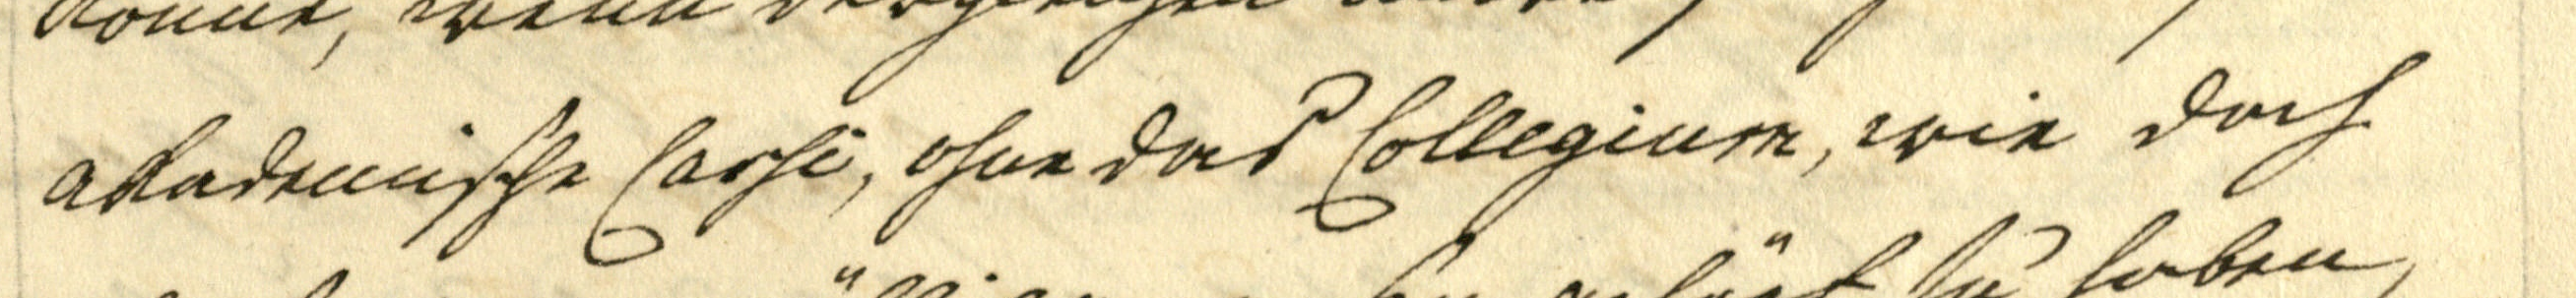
akademische Casse, ohne das Collegium, wie doch
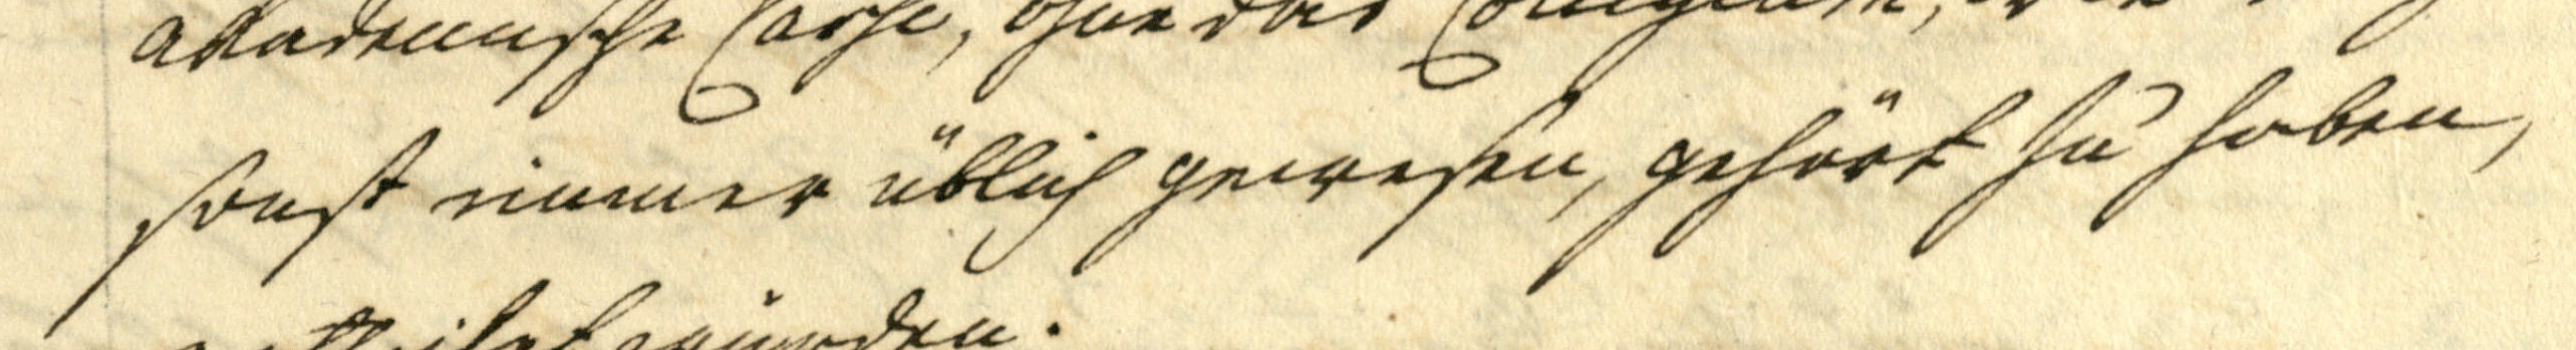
sonst immer üblich gewesen, gehört zu haben,
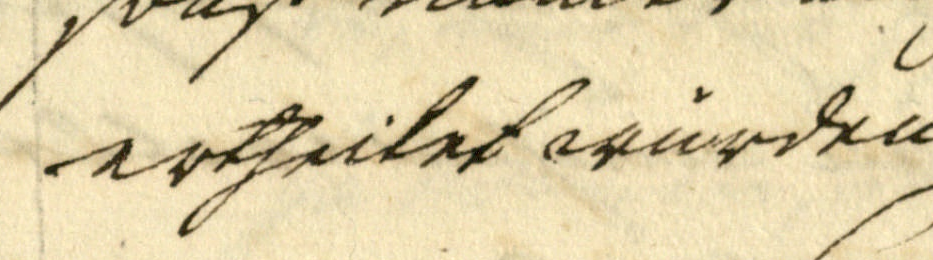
ertheilet würden.
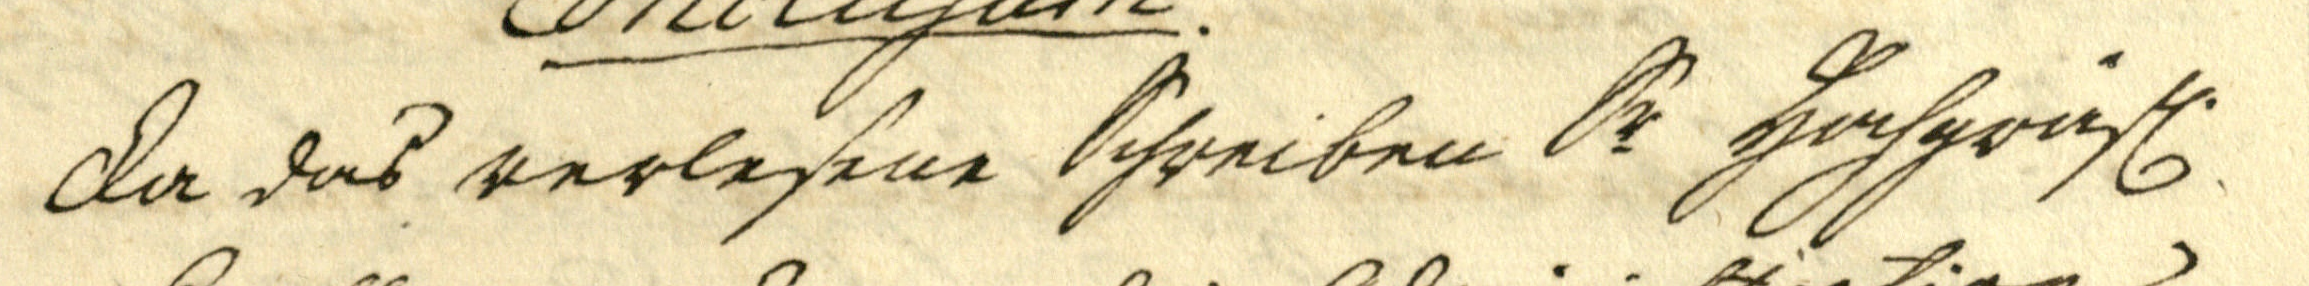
Da das verlesene Schreiben Sr Hochgräfl.
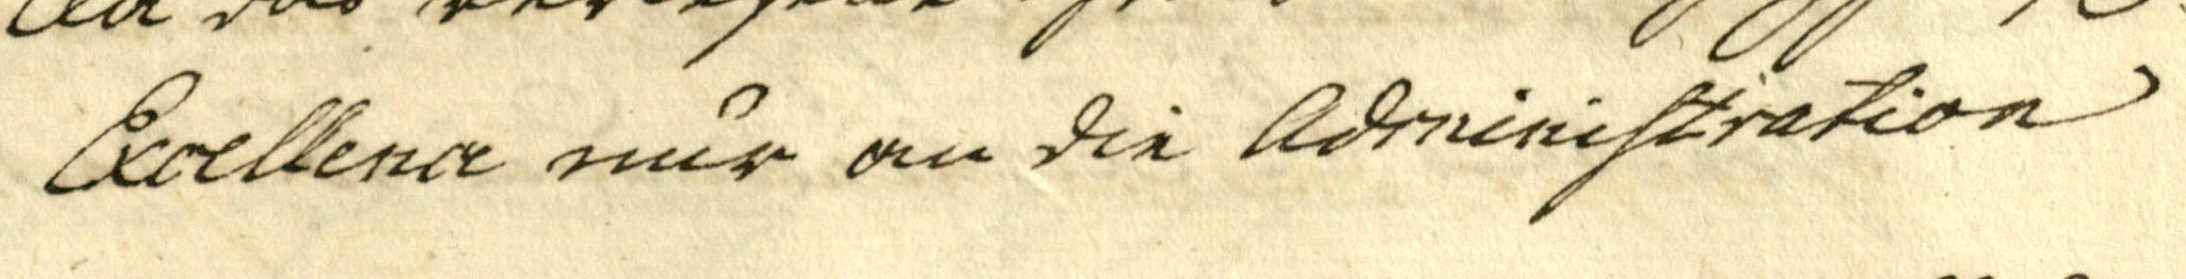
Excellence nur an die Administration
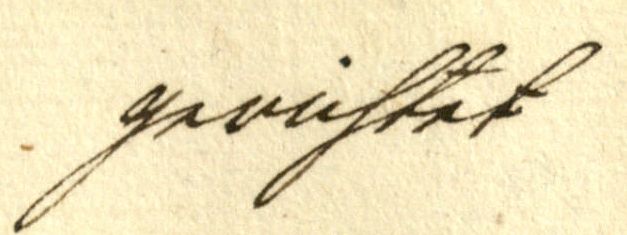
gerichtet
